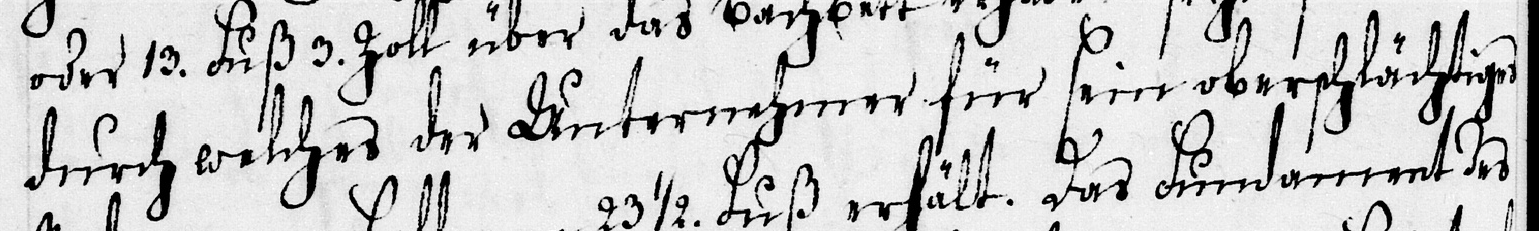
durch welches der Unternehmer für sein oberschlächtiges
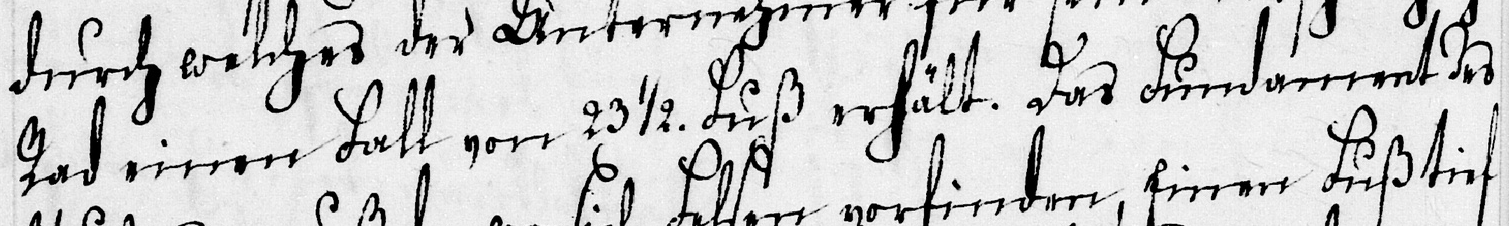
Rad einen Fall von 23 ½. Fuß erhält. Das Fundament des
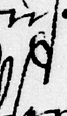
st,
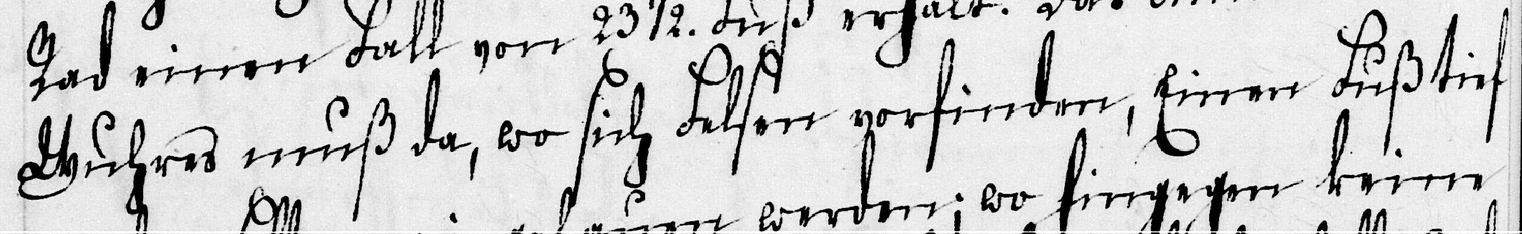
Wuhres muß da, wo sich Felsen vorfinden, Einen Fußtief
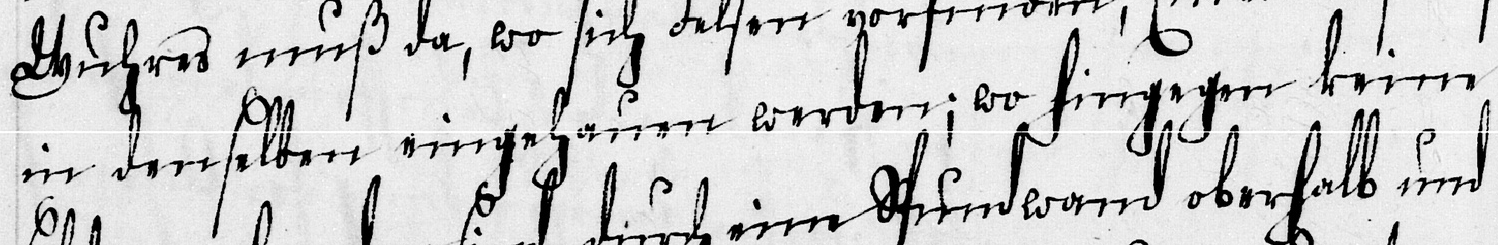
in denselben eingehauen werden; wo hingegen keine
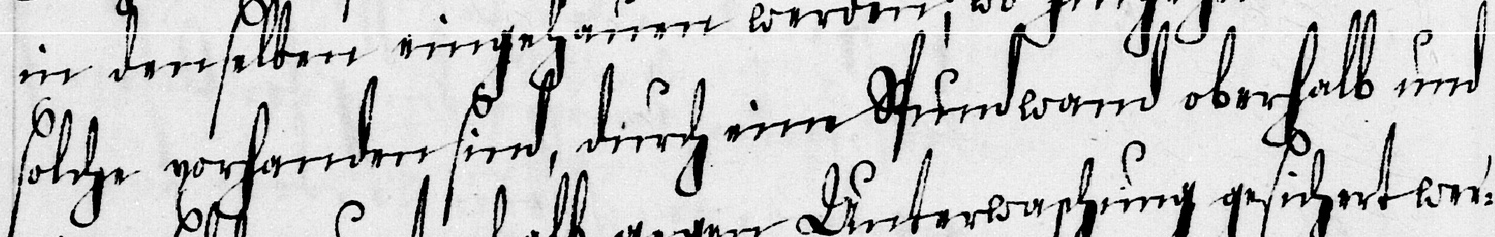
solche vorhanden sind, durch eine Spundwand oberhalb u¬
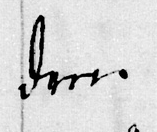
den.
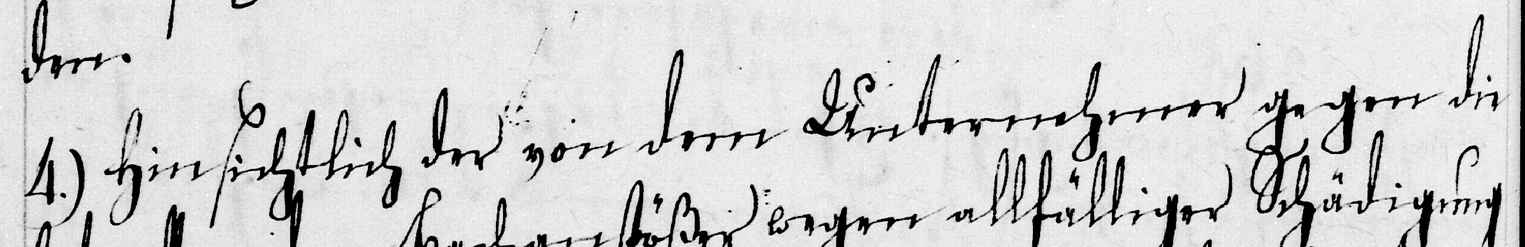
4.) Hinsichtlich der von dem Unternehmer gegen die
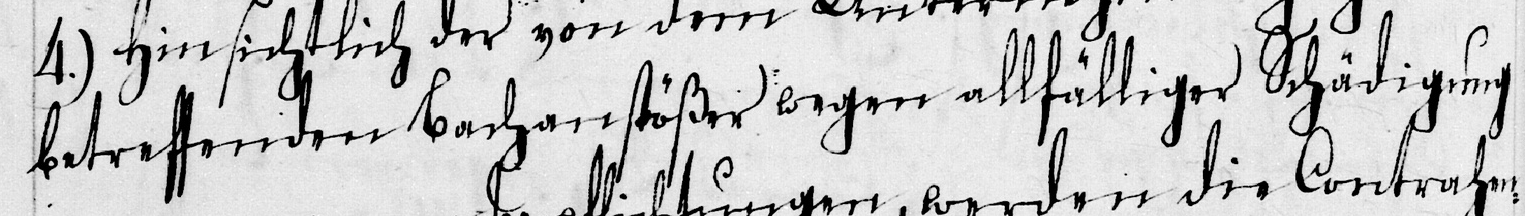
betreffenden Bachanstößer wegen allfälliger Schädigung
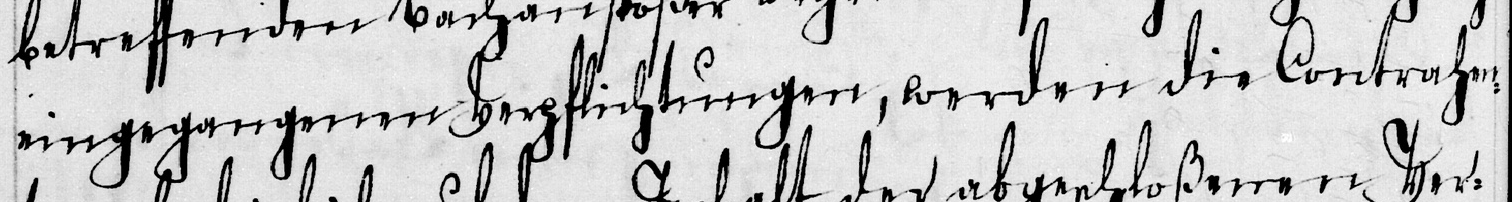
eingegangenen Verpflichtungen, werden die Contrahen¬
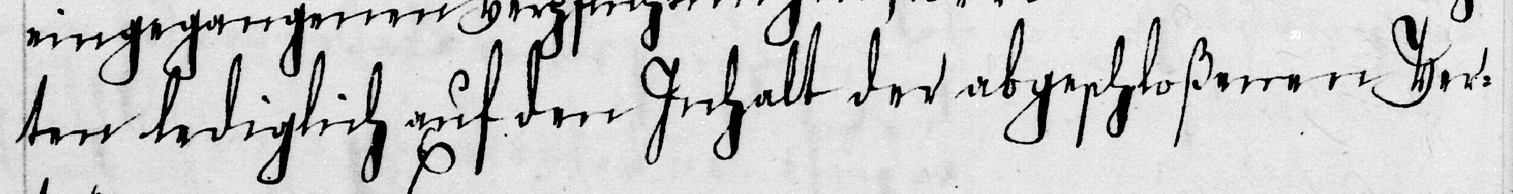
ten lediglich auf den Inhalt der abgeschloßenen Ver¬
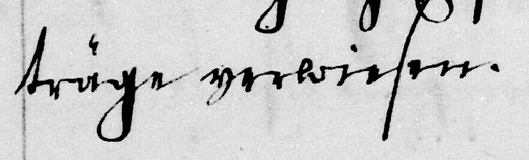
träge verwiesen.
